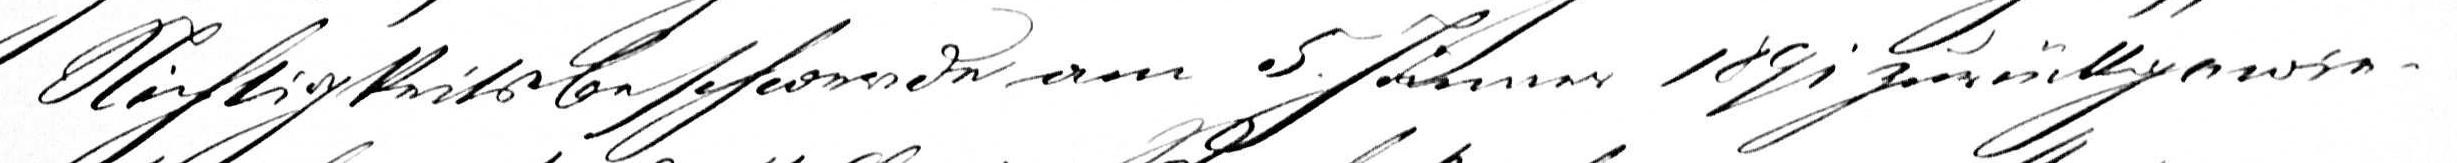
Nichtigkeitsbeschwerde am 5. Jänner 1891 zurückgewie¬
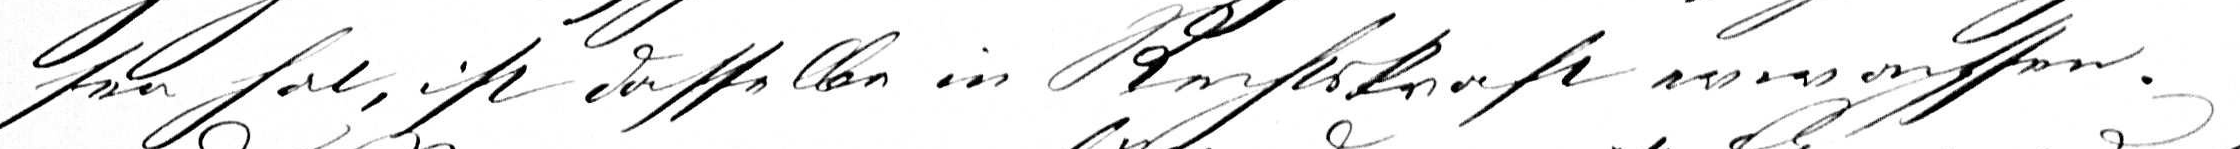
sen hat, ist dasselbe in Rechtskraft erwachsen.
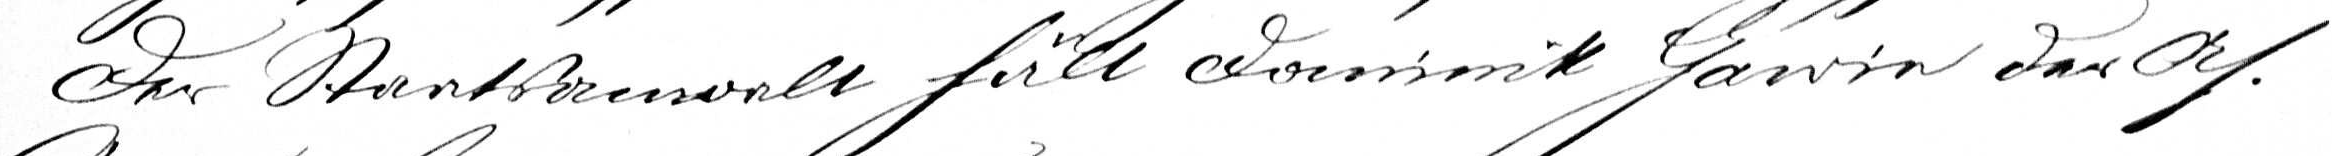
Der Staatsanwalt hält Dominik Gawin der Ah.
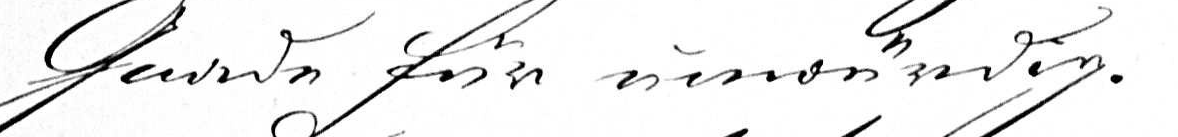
Gnade für unwürdig.
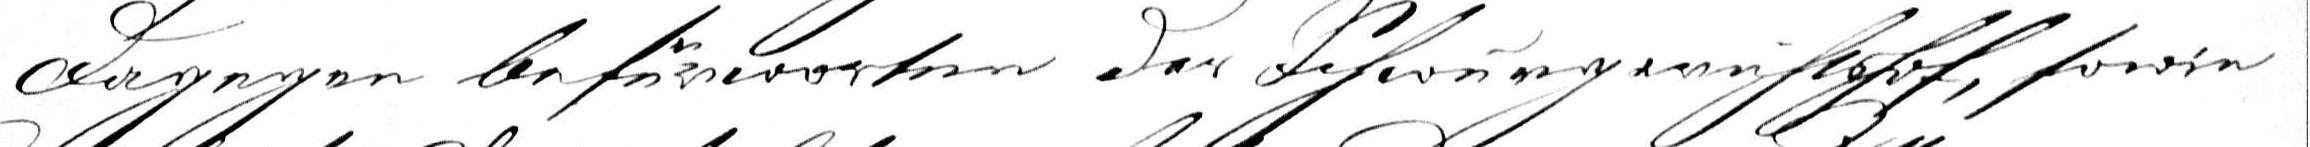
Dagegen befürworten der Schurgerichtshof, sowie
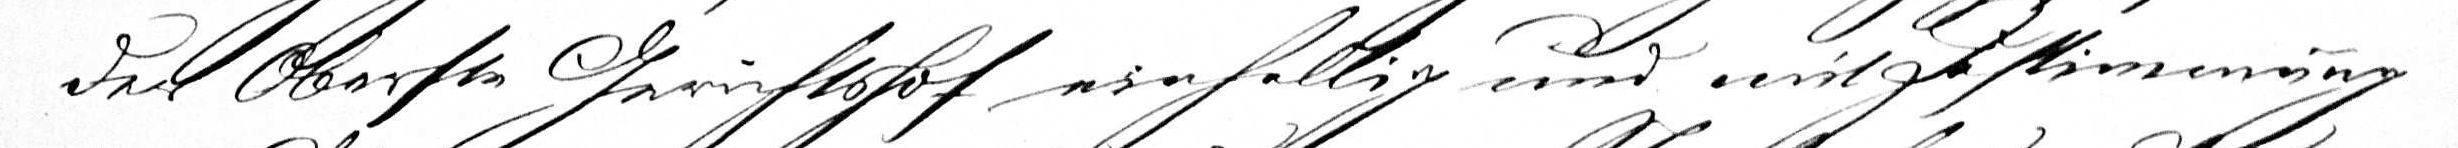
der Oberste Gerichtshof einhellig und mit Zustimmung
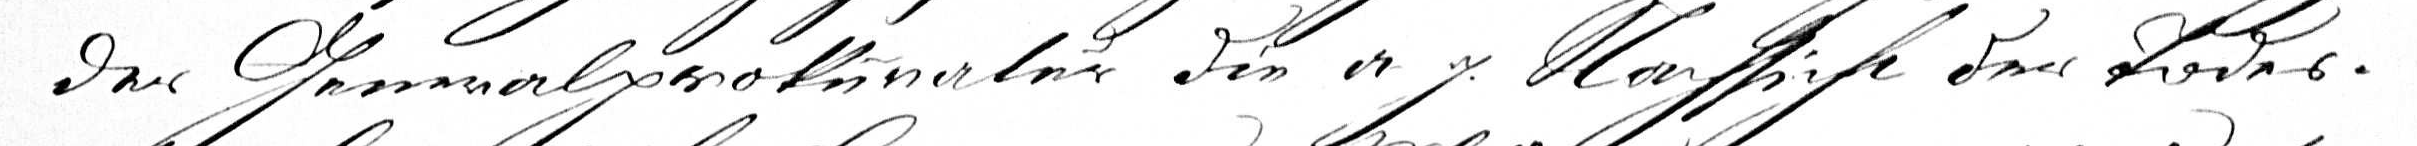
der Generalprokuratur die a.g. Nachsicht der Todes¬
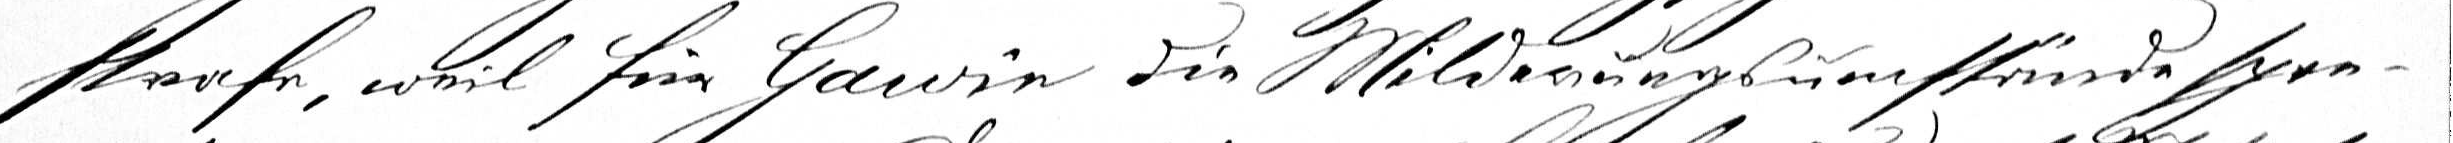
strafe, weil sie Gawin die Milderungsumstände spre¬
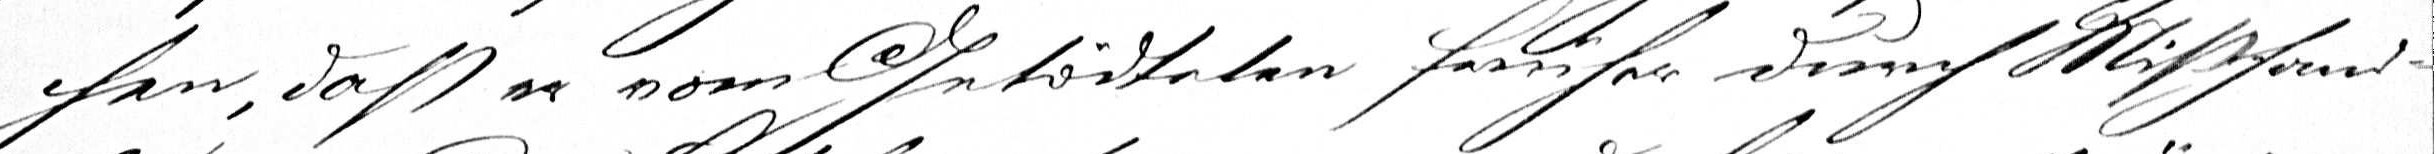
chen, daß er vom Getödteten früher durch Mißhand¬
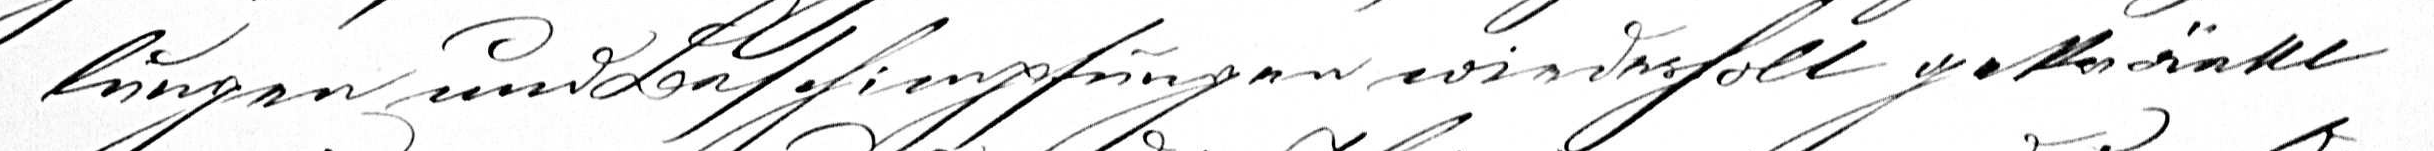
lungen und Beschimpfungen wiederholt gekränkt
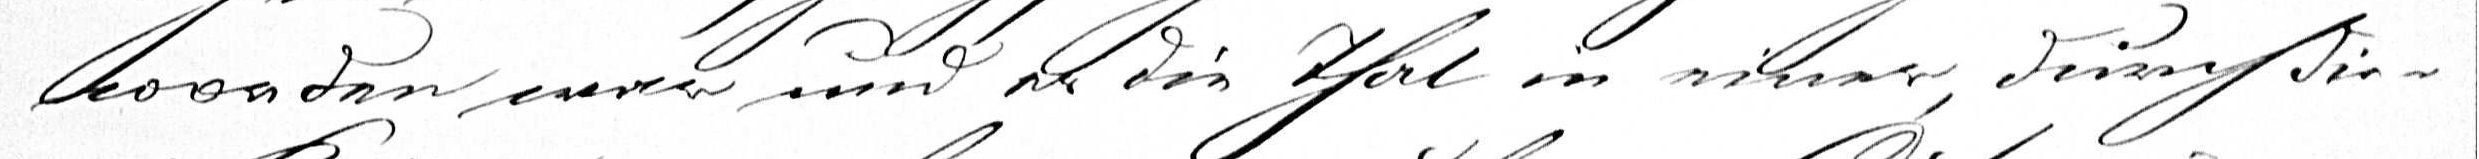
worden war und die That in einer durch die¬
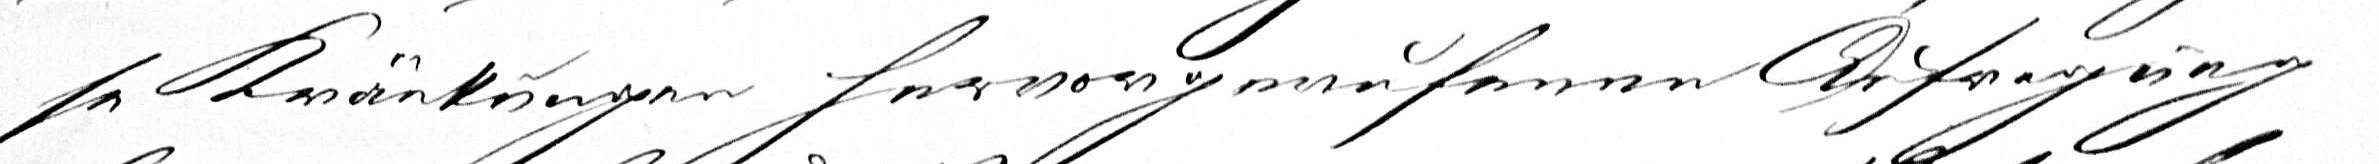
se Kränkungen hervorgerufenen Aufregung
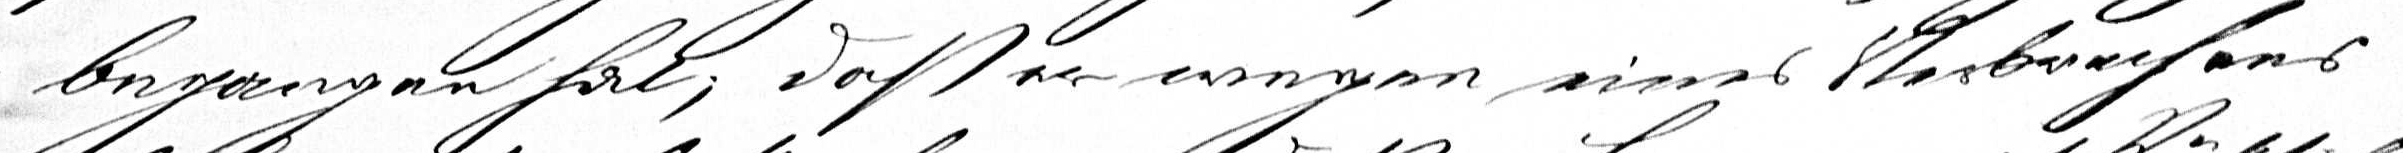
begangen hat, daß er wegen eines Verbrechens
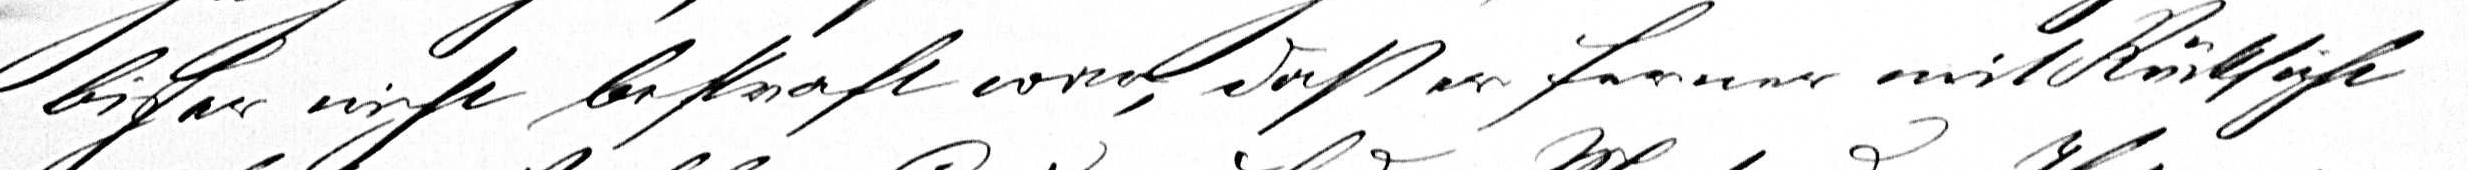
bisher nicht bestraft war, daß er ferner mit Rücksicht
